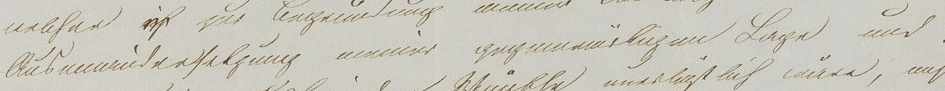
Auseinandersetzung meiner gegenwärtigen Lage und
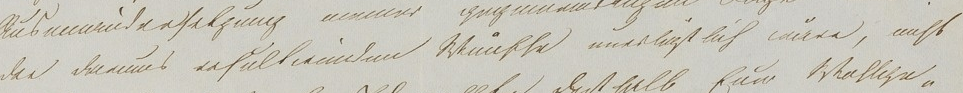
den daraus resultirenden Wünsche unerläßlich wäre, nicht
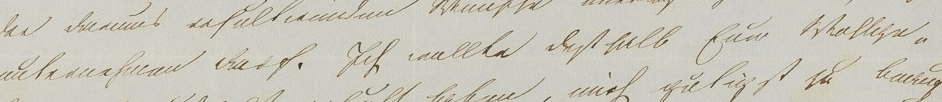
unternehmen darf. Ich wollte deßhalb Euer Wohlge-
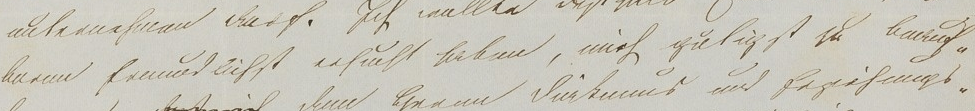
boren freundlichst ersucht haben, mich gütigst zu beauf-
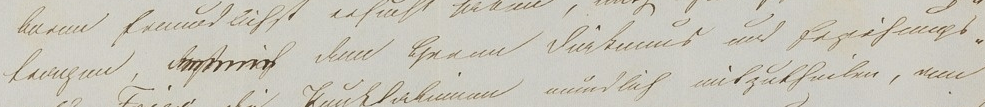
tragen, daß ich dem Herrn Diakonus und Erziehungs-
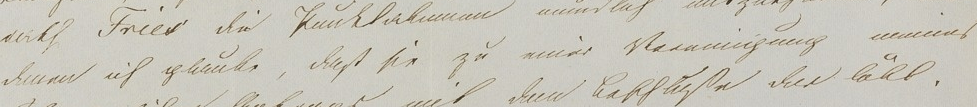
denen ich glaube, daß sie zu einer Vereinigung meines
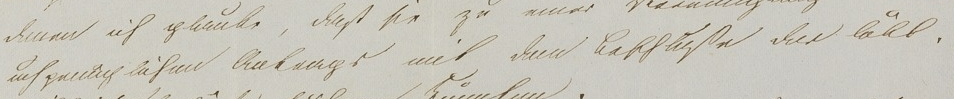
ursprünglichen Antrags mit dem Beschlusse der löbl.
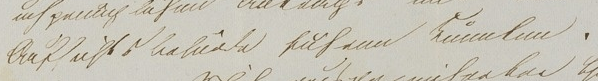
Aufsichtsbehörde führen könnten.
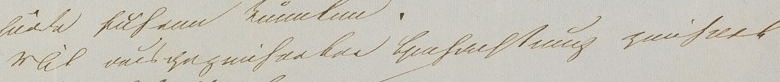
Mit ausgezeichneter Hochachtung zeichnet
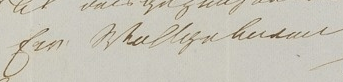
Ew. Wohlgeboren
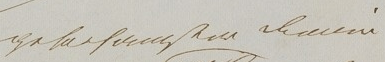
gehorsamster Diener
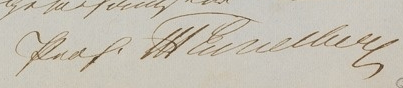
Prof. ...Eichelberg
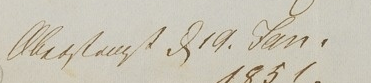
Oberstraß d 19. Jan.
